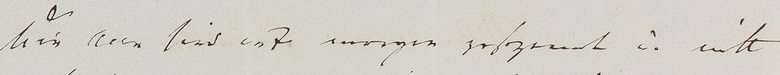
Wir Alle sind auf morgen gespannt u. nicht
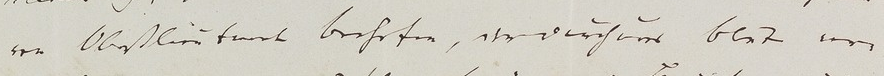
von Oberstlieutnant Bachofen, der durchaus Blut ver-
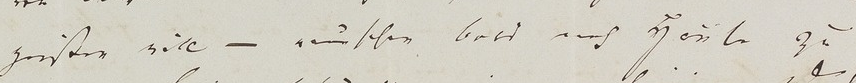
gießen will – wünschen bald nach Hause zu
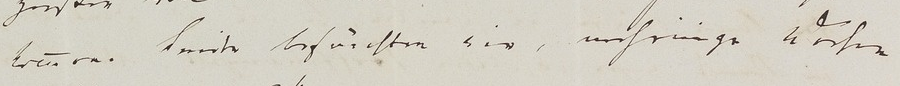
kommen. Leider befürchten wir, noch einige Wochen
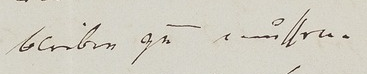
bleiben zu müssen.
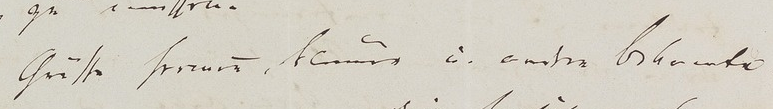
Grüsse Hermann, Blumer u. andre Bekannte.
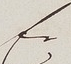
Er
